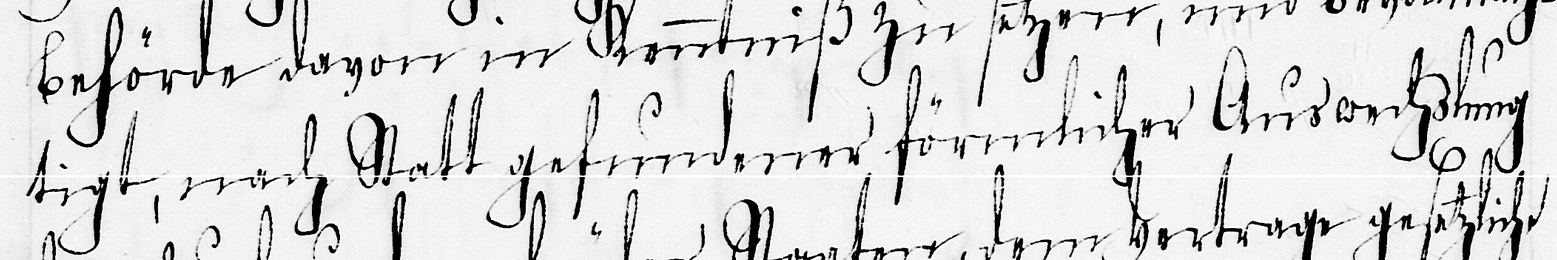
tigt, nach Statt gefundener förmlicher Auswechslung
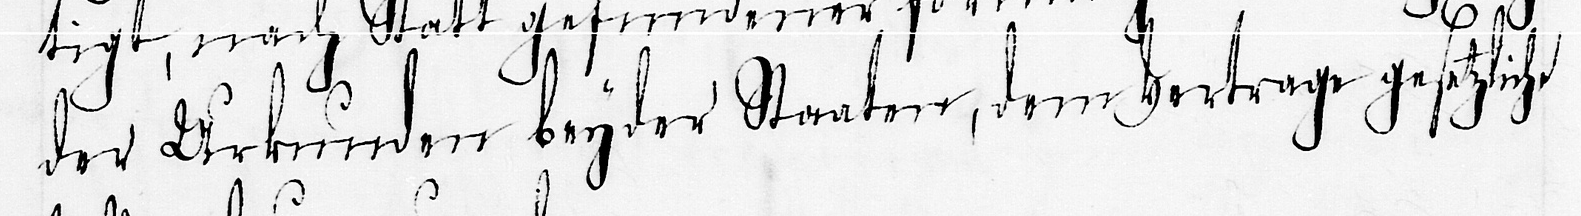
der Urkunden beyder Staaten, dem Vertrage gesetzlic¬
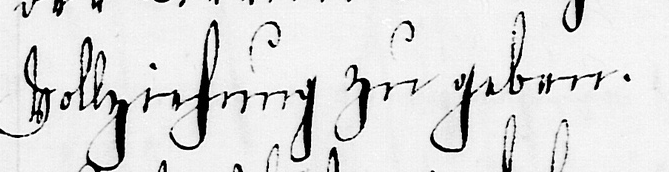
Vollziehung zu geben.
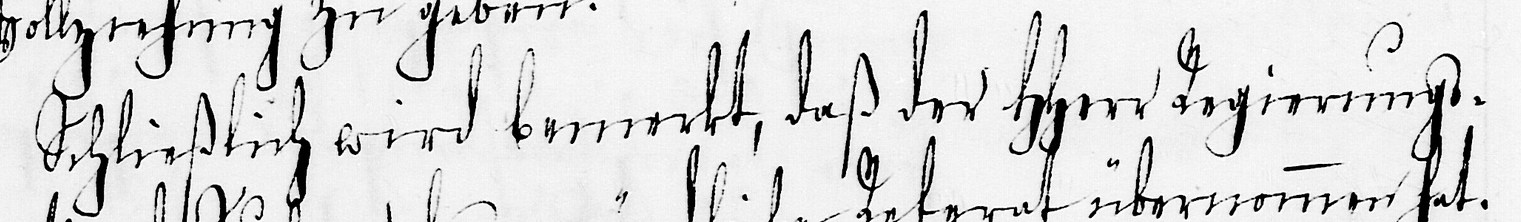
Schließlich wird bemerkt, daß der HHerr Regierungs¬
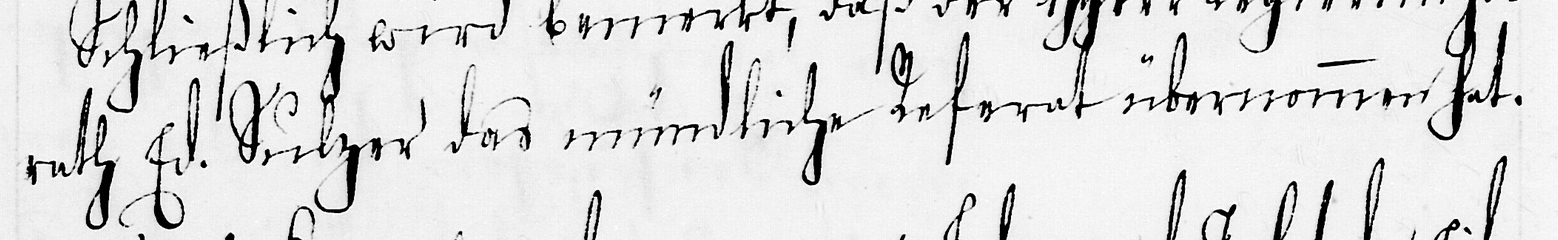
rath Ed. Sulzer das mündliche Referat übernommen hat.
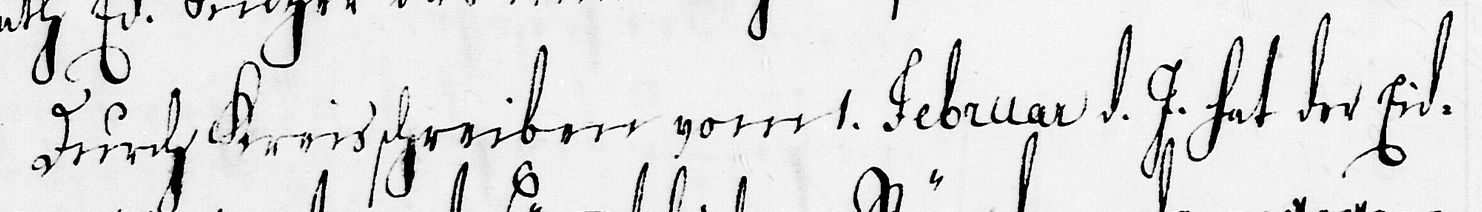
Durch Kreisschreiben vom 1. Februar d. J. hat der Eid¬
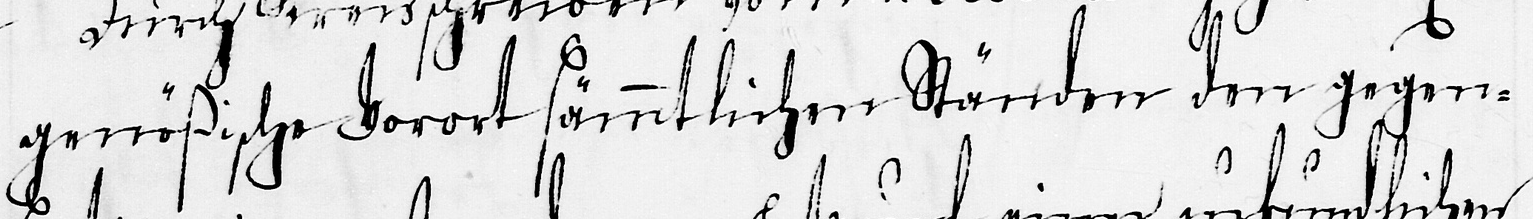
genößische Vorort sämmtlichen Ständen den gegen¬
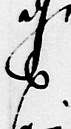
s¬
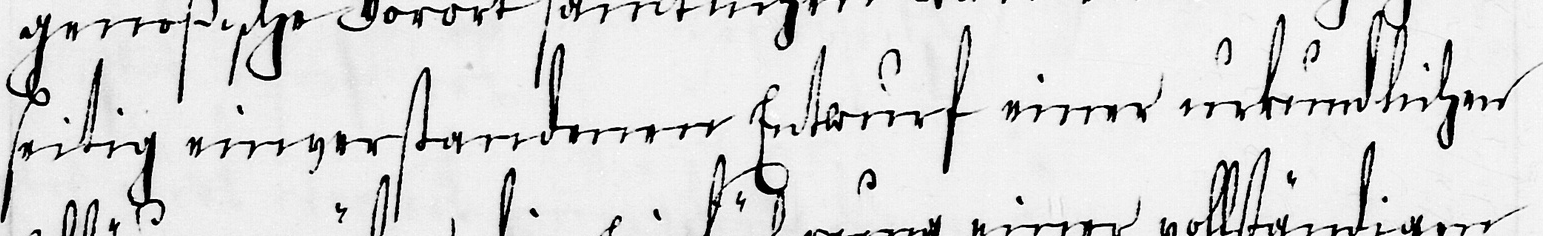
eitig einverstandenen Entwurf einer urkundlichen
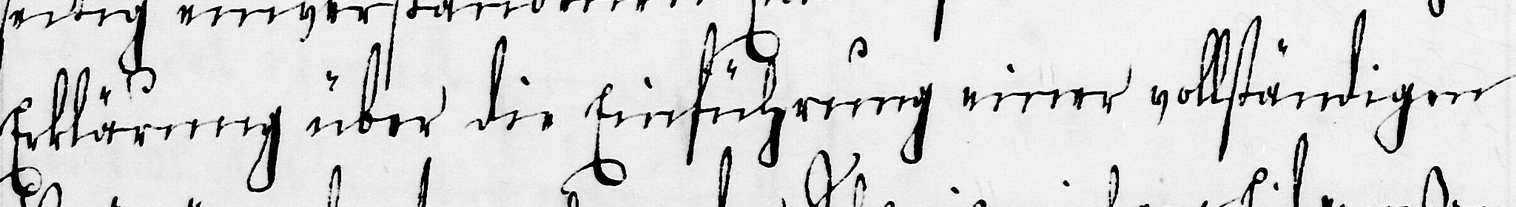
Erklärung über die Einführung einer vollständigen
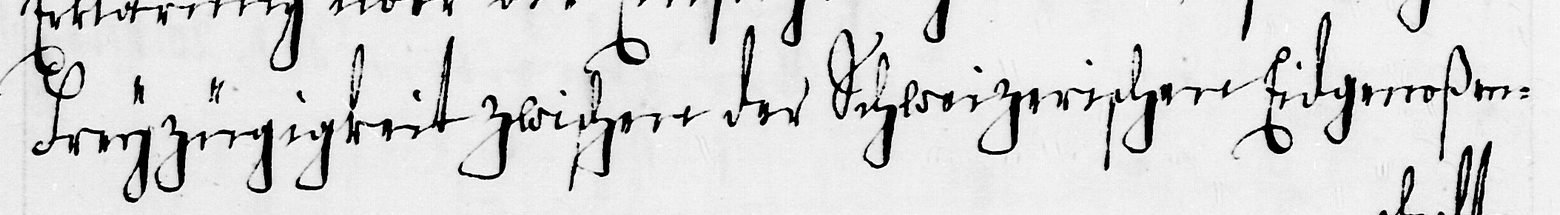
Freyzügigkeit zwischen der Schweizerischen Eidgenoßen-
